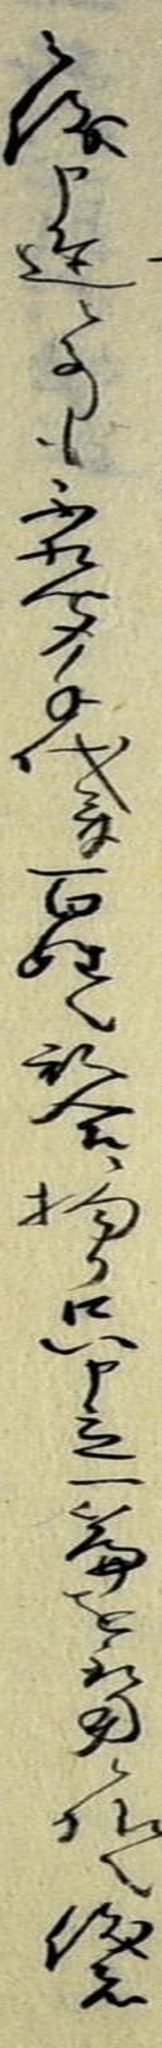之儀申達候事も不相聞手代并百姓之形合に拘り只申立一篇を取用候様之儀は
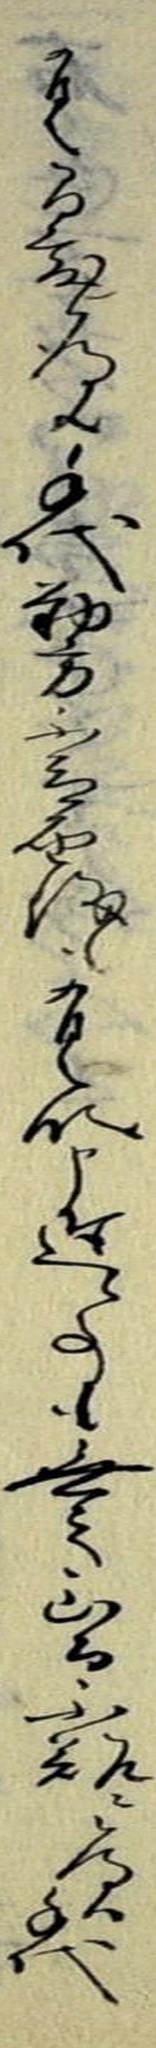有之間敷候得共手代勤方不参届儀も有之段申達候事も無之至而不難に候得は手代
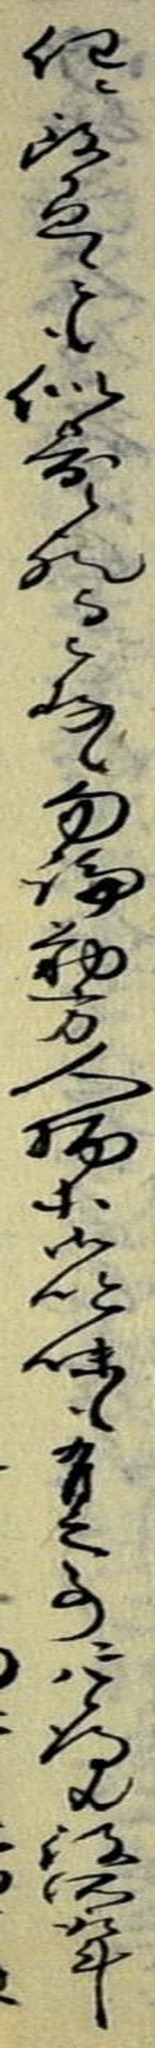任に致置候にも似寄候歟与被存候勿論勤方人柄等御吟味も有之事には候得共役所取斗
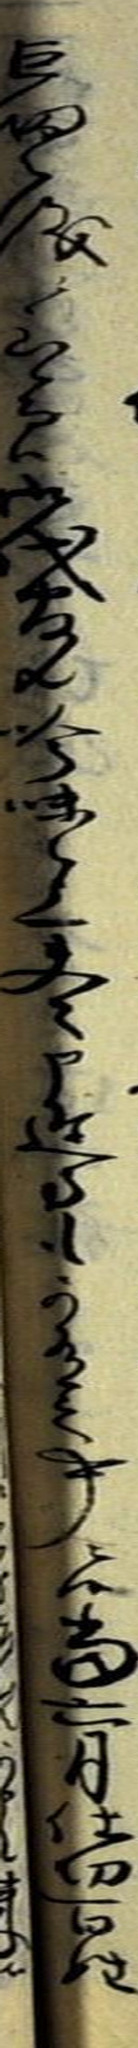巨細之儀に至候而は御代官共吟味之上夫々申達事も可有之事に候当六月仕切百姓
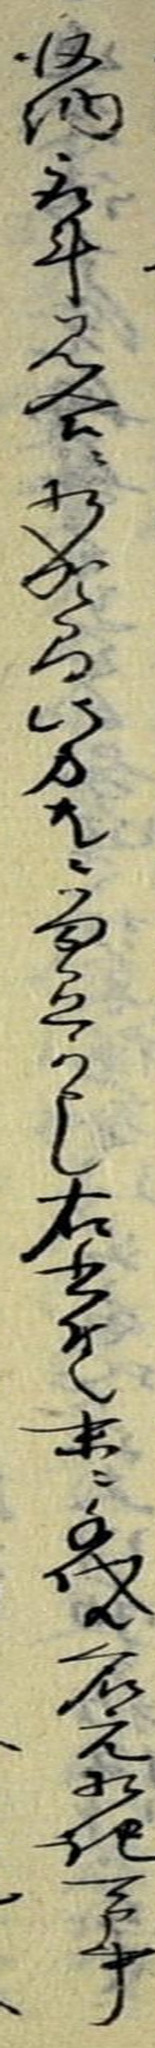収納取斗見合に相成候間此方共に留置可申候右書付之末に手代共名元相記可申事
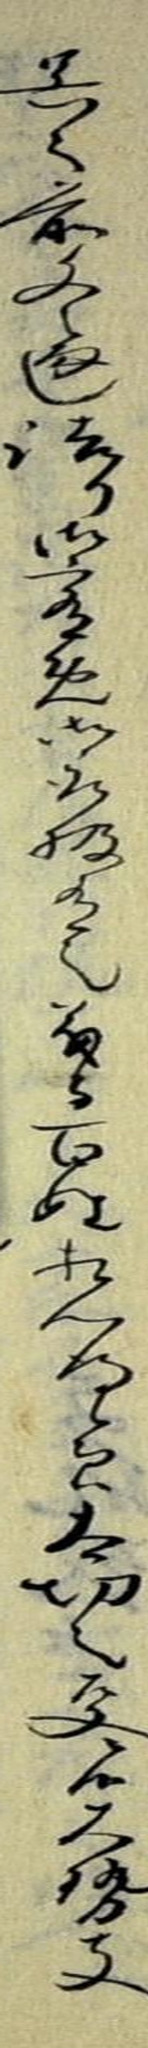呉々前文之通詰り御宥免御取扱有之義与百姓相心得候而は太切之事に候大勢支
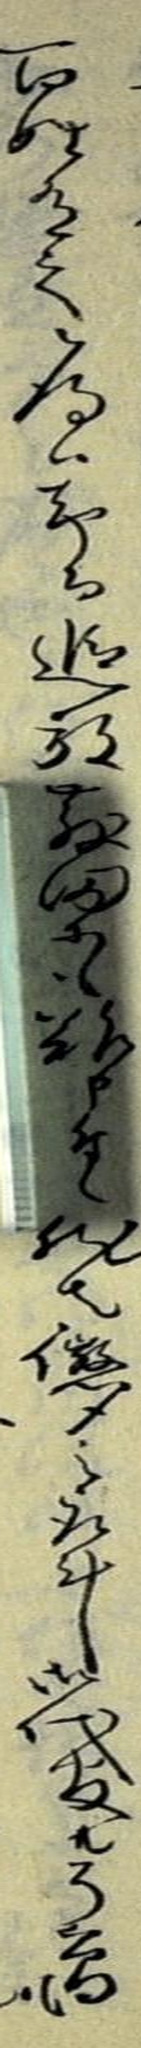百姓有之候得は却而追放散田等も難申付候然者懲め之取斗御代官共了簡も
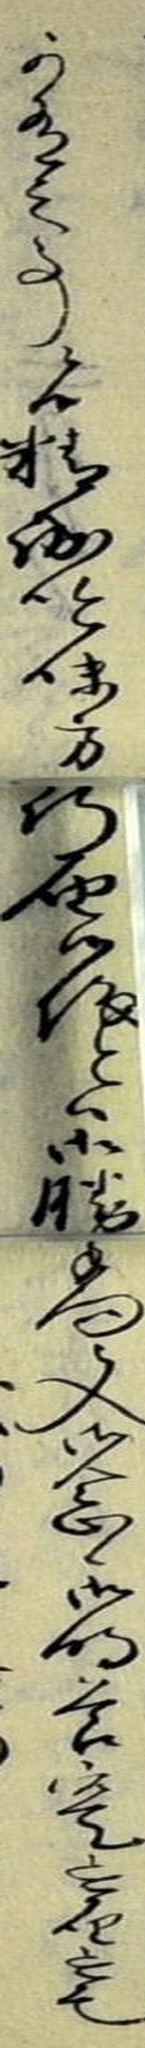可有之事に候精誠吟味方行届候儀とは御勝手向に入御念候御時節寔壱厘壱毛
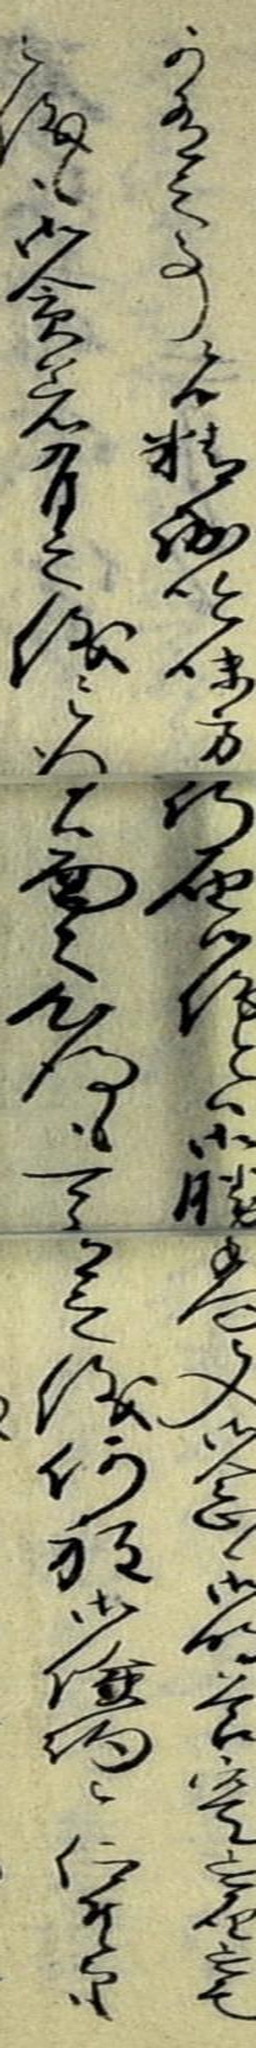之儀も御貪着有之儀に候得は面々心得も可有之儀何程御倹約被仰付候而も
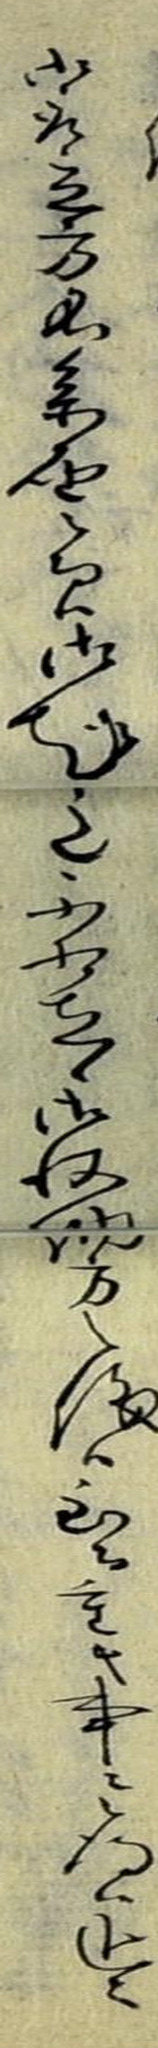御取立方不参届に而は御趣意不相立候御収納方之儀は至而重き事に候得は追々
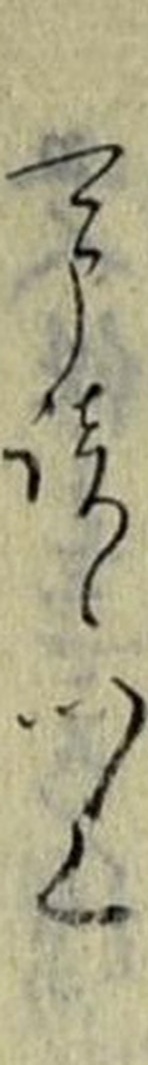可申談候以上
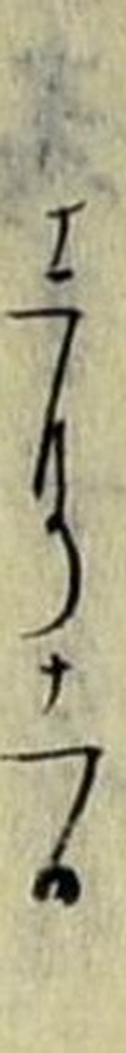十二月十一日
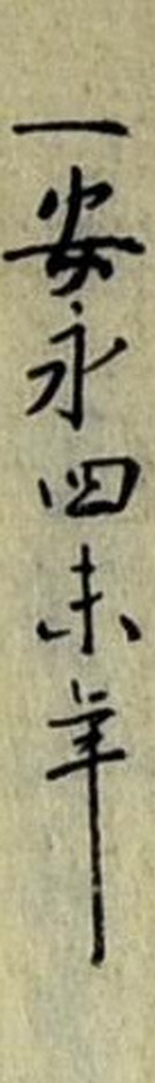一安永四未年
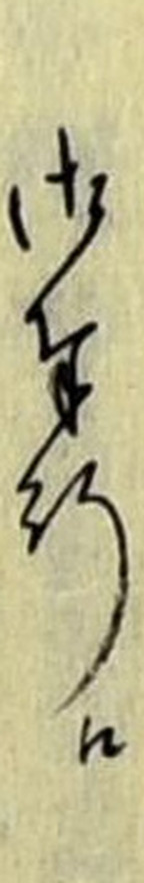御奉行え
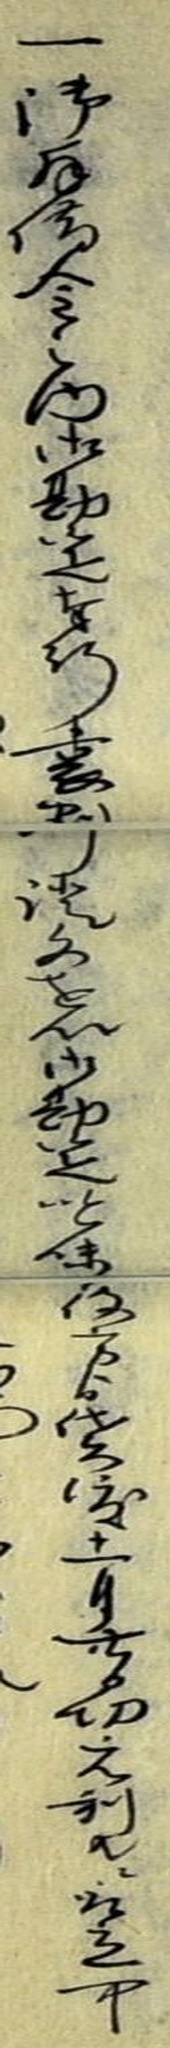一御拝借金之内御勘定奉行裏判証文を以御勘定吟味役方ゟ貸渡十一月廿日切元利共に取立可
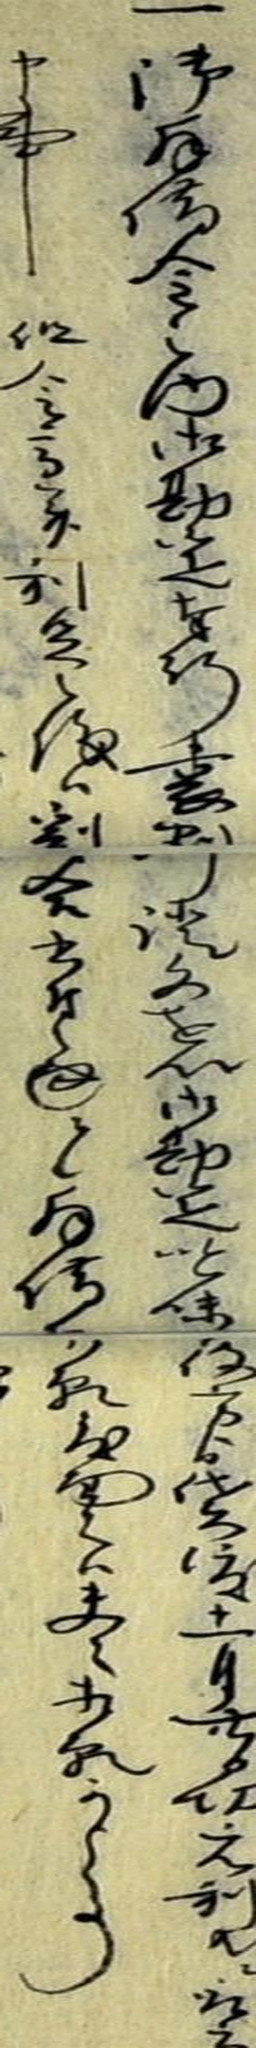申事但金高并利足之儀は割合書付之通に候拝借相願度面々は夫々相願可申事
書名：命令之部 二
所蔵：福井県文書館 Fukui Prefectural Archives
